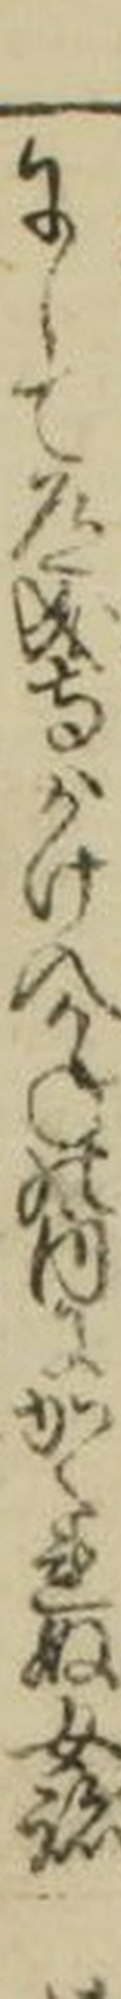にして道成寺へかけ入かねの内にかくれぬ女跡
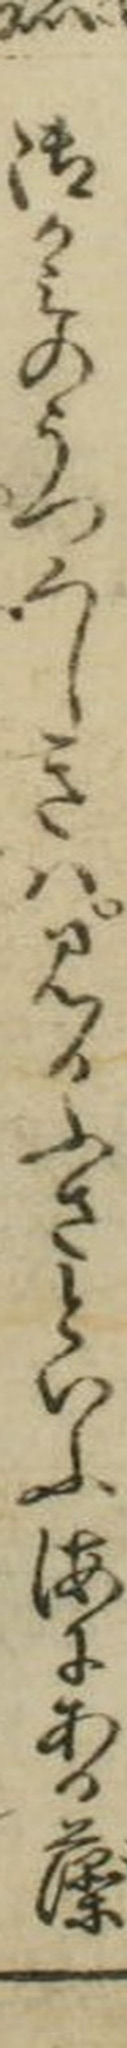御かみのうつくしきは。みるふさといふ海にある藻
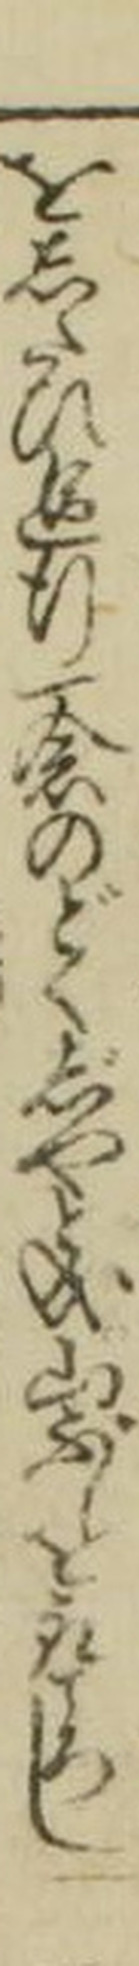をしたひ追行一念のどくじやと成山ぶしを取ころし
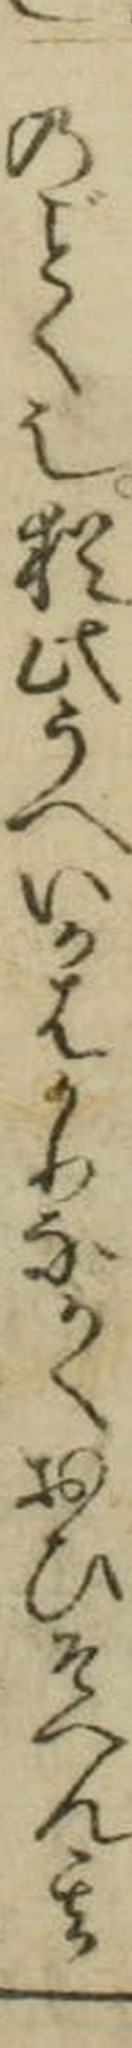のごとく也。猶此うへいかはかりなかくおひそへん其
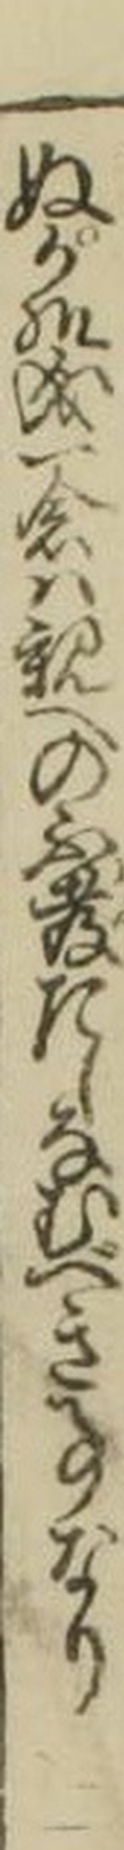ぬ。か様成一念は親への不孝たしなむべき事なり
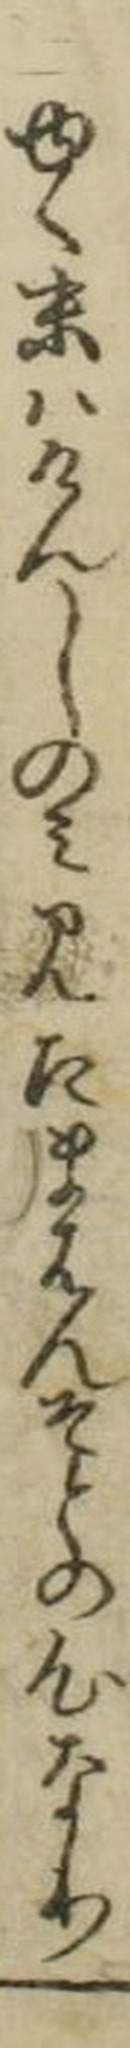ゆく末はけんしのみ見たまはんそとの心なり
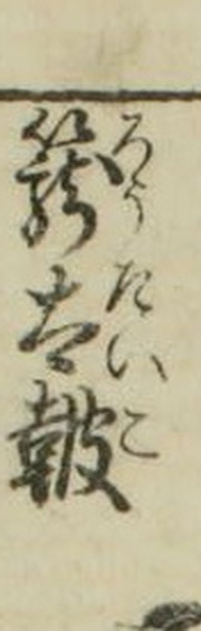籠太鼓
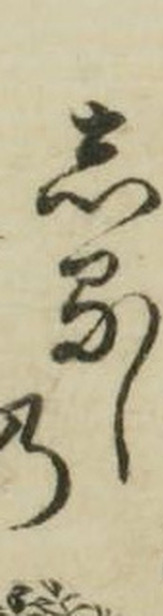しるしの
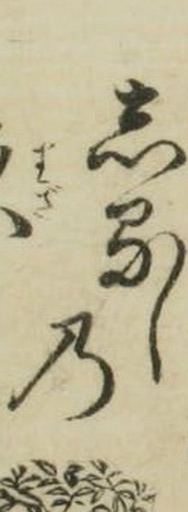しるしの
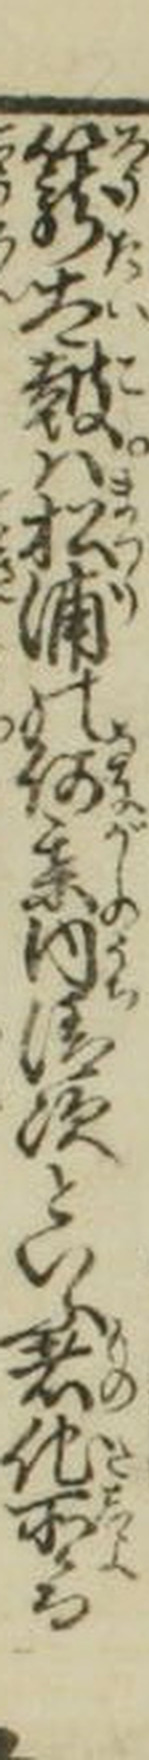籠太鼓は。松浦の何某内清次といふ者他所にて
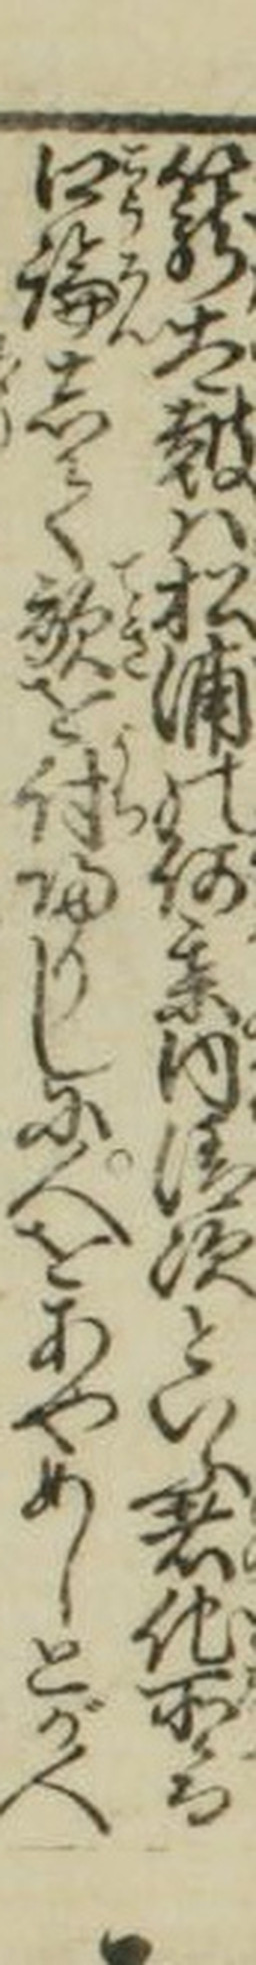口論して敵を討帰りしに。人をあやめしとが人
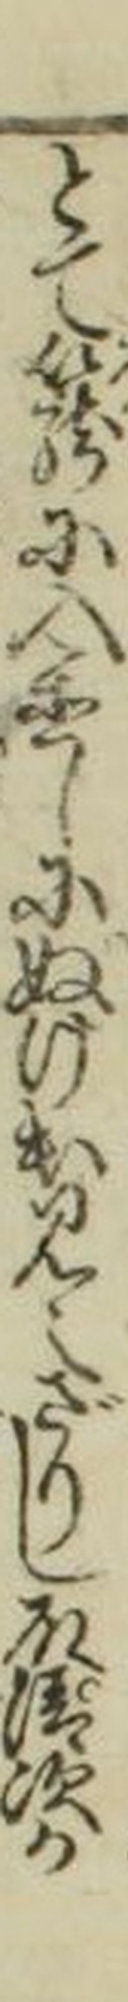とて籠に入置しに。ぬけ出見えざりし故。清次か
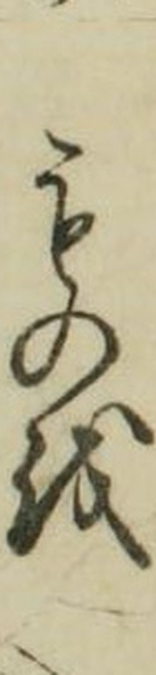ものを
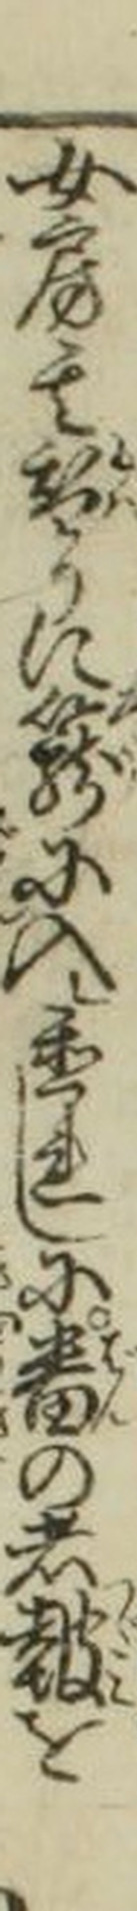女房其替りに籠に入れ置れしに。番の者報を
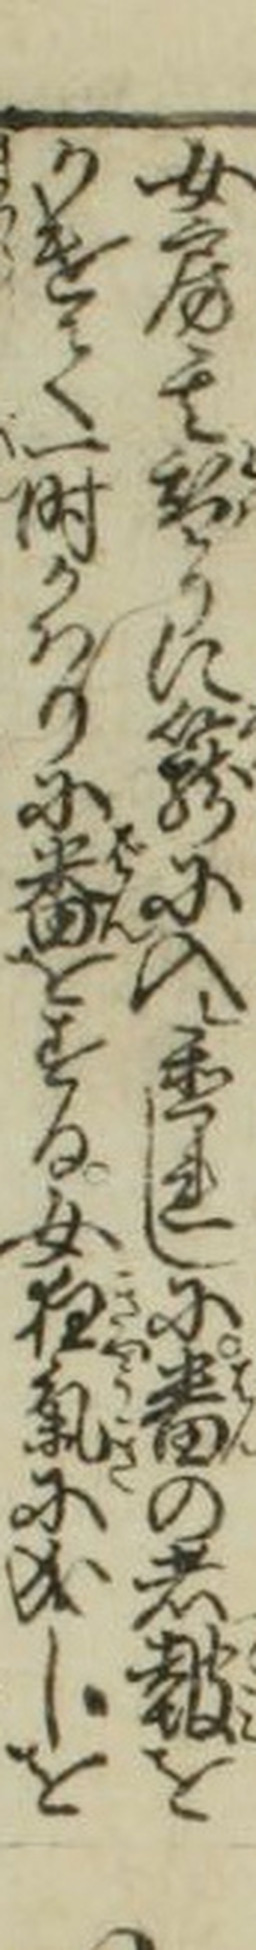かけて一時かはりに番をする。女狂気に成しを
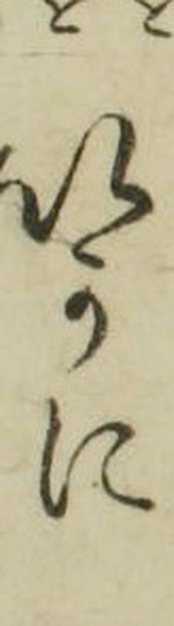いかに
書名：女源氏教訓鑑
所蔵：東京学芸大学附属図書館
